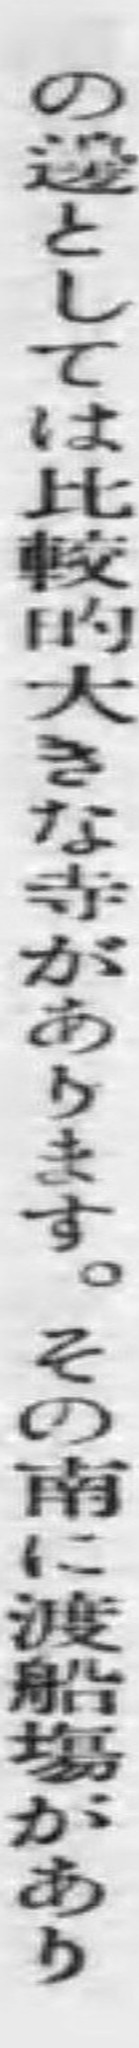の邊としては比較的大きな寺があります。その南に渡船塲があり
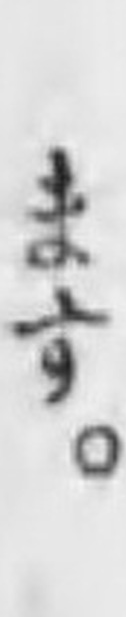ます。
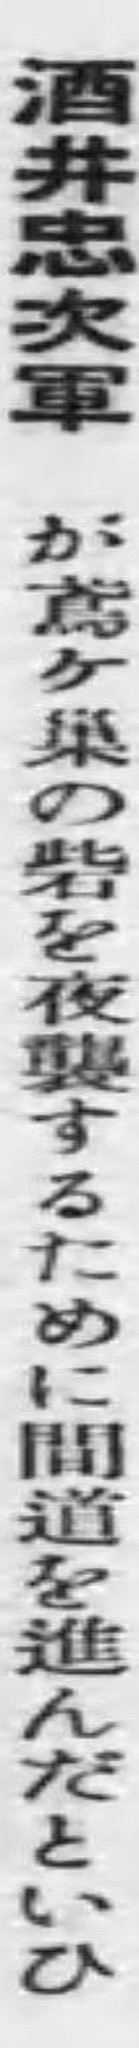酒井忠次軍が鳶ヶ巢の砦を夜襲するために間道を進んだといひ
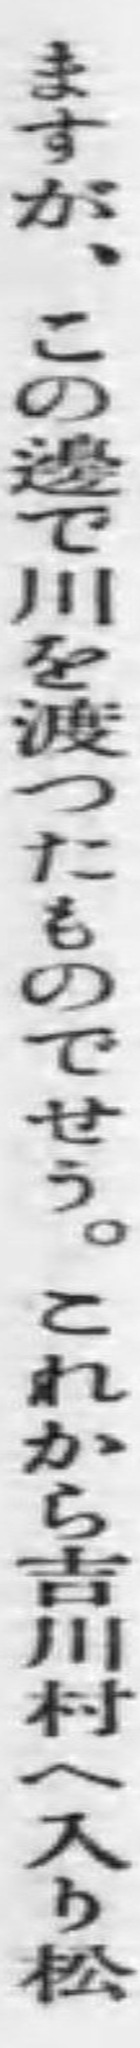ますが、この邊で川を渡つたものでせう。これから吉川村に入り松
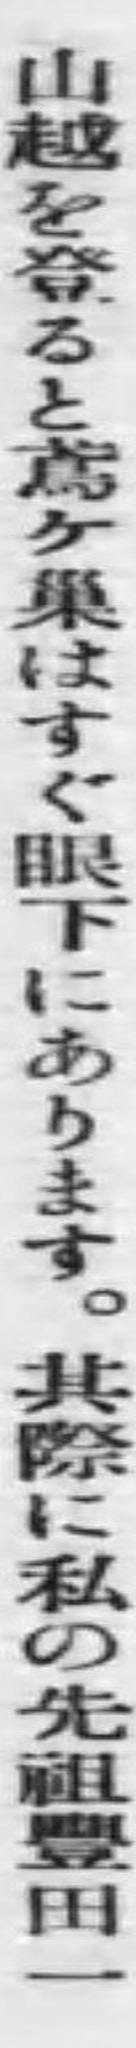山越を登ると鳶ヶ巢はすぐ眼下にあります。其際に私の先祖豊田一
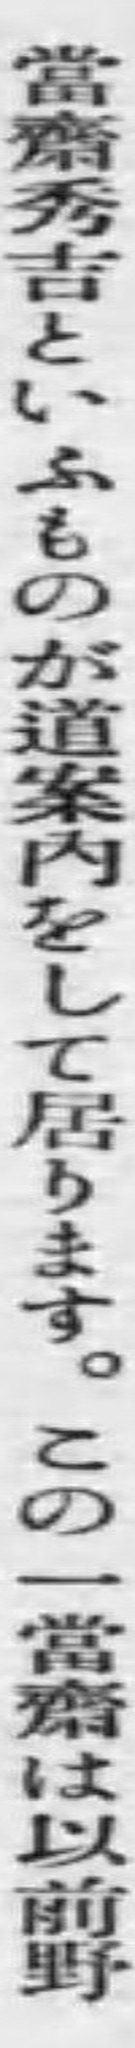當齋秀吉といふものが道案内をして居ります。この一當齋は以前野
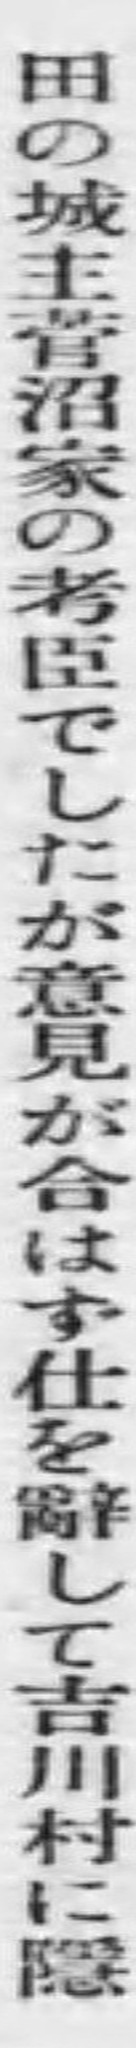田の城主菅沼家の考臣でしたが意見が合はず仕を辭して吉川村に隠
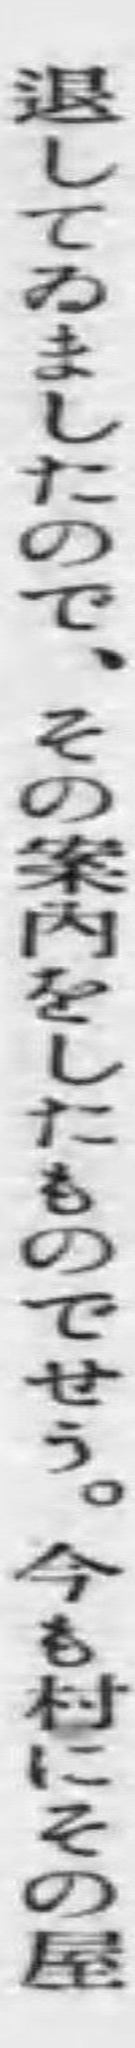退してゐましたので、その案内をしたものでせう。今も村にその屋
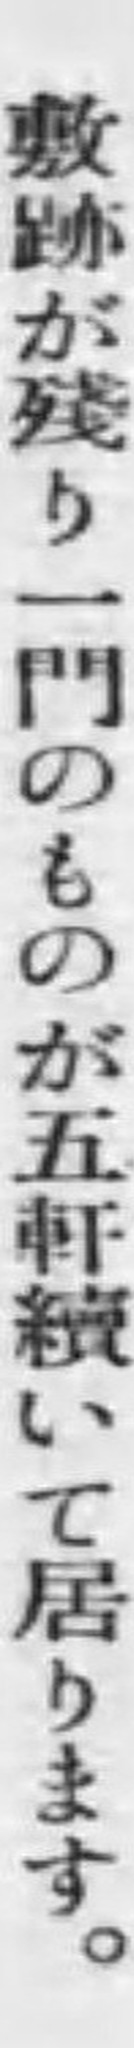敷跡が殘り一門のものが五軒續いて居ります。
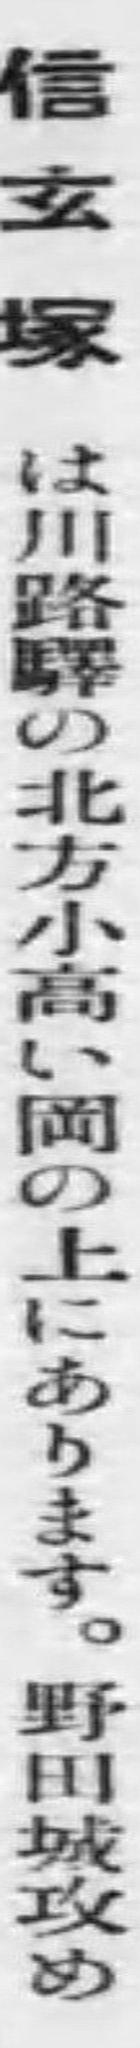信玄塚は川路驛の北方小高い岡の上にあります。野田城攻め
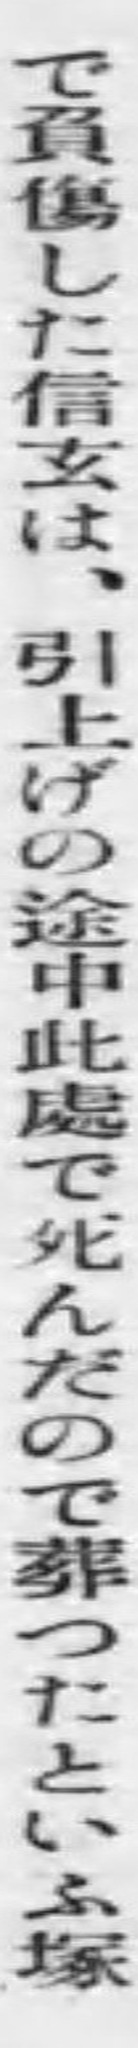で負傷した信玄は、引上げの途中此處で死んだので葬つたといふ塚
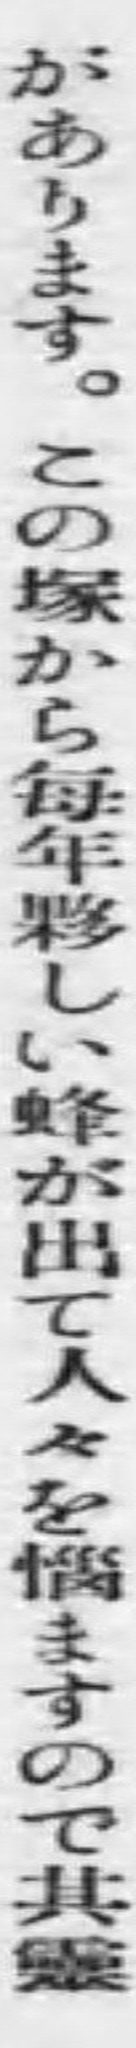があります。この塚から毎年夥しい蜂が出て人々を惱ますので其靈
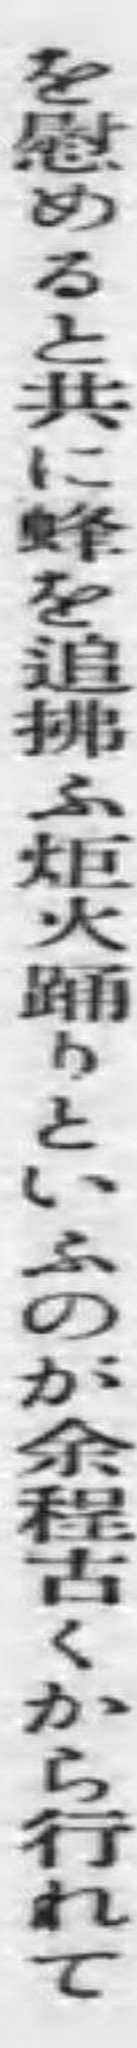を慰めると共に蜂を追拂ふ炬火踊りといふのが余程古くから行れて
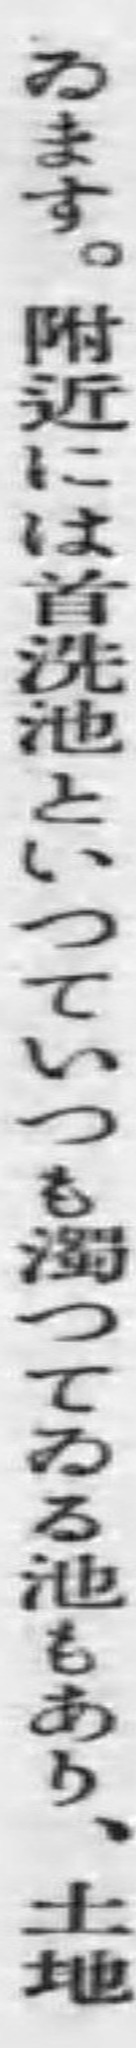ゐます。附近には首洗池といつていつも濁つてゐる池もあり、土地
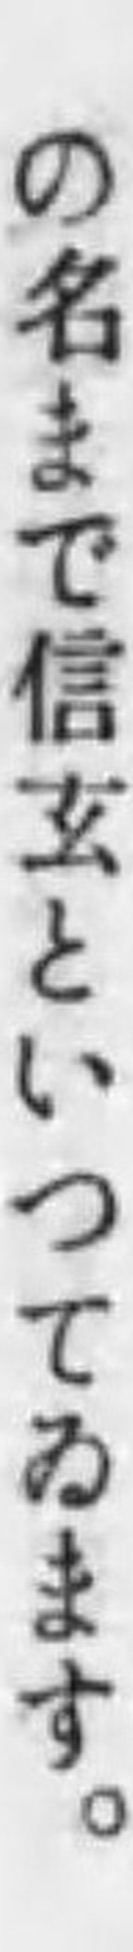の名まで信玄といつてゐます。

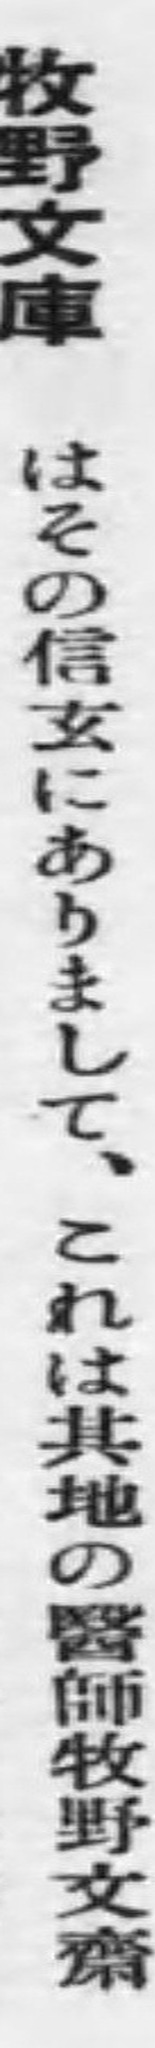牧野文庫はその信玄にありまして、これは其地の醫師牧野文齋
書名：東三河道中記 : 豊橋市及其附近案内
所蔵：国立国会図書館 National Diet Library, JAPAN
